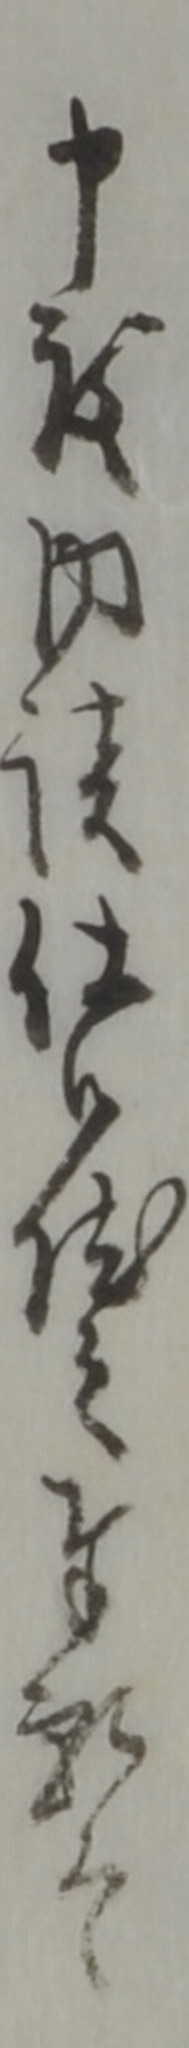申度内談仕候依之奉願上候
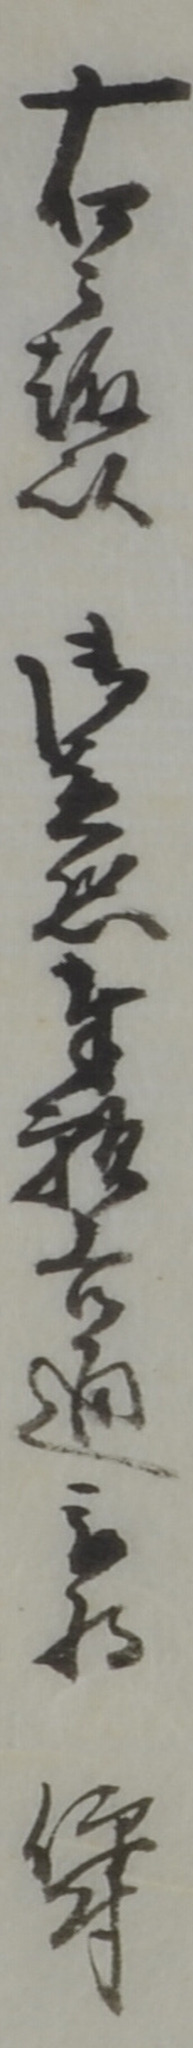右之趣以御慈悲奉願上候通被為仰付
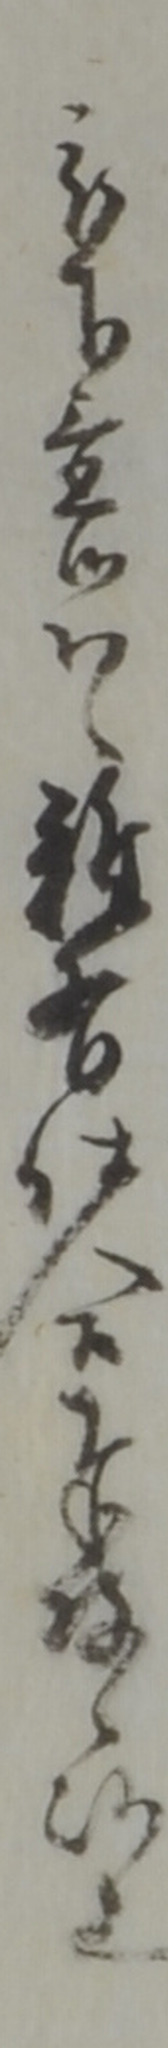被下置候ハヽ難有仕合奉存候以上
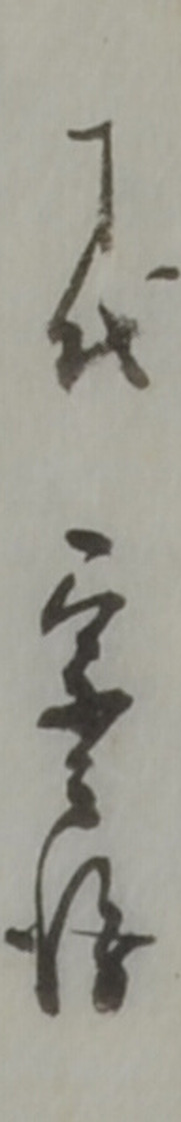丁代宗兵衛
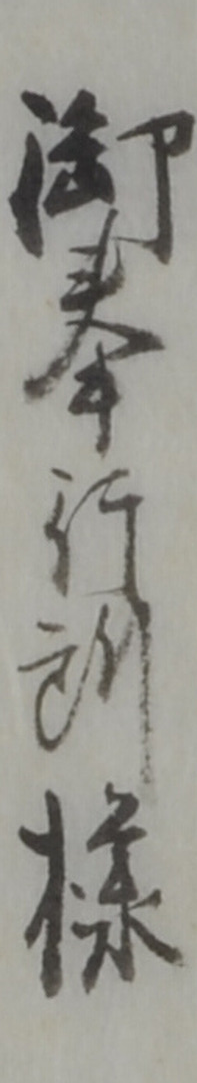御奉行所様
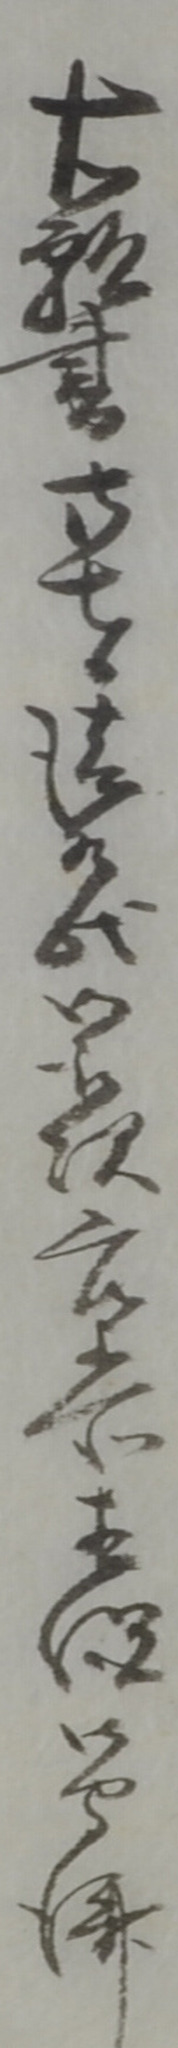右願書廿七日清水氏御取次差上所直様御聞済
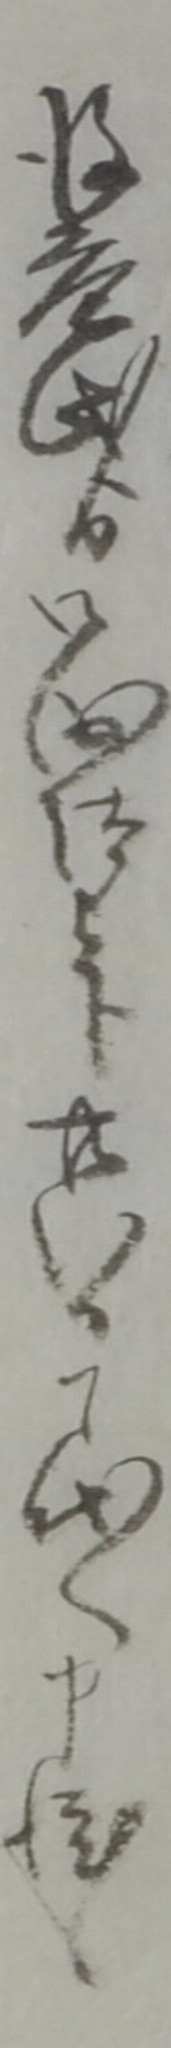後藤氏ゟ御沙汰被下廿八日丁代へ申渡候

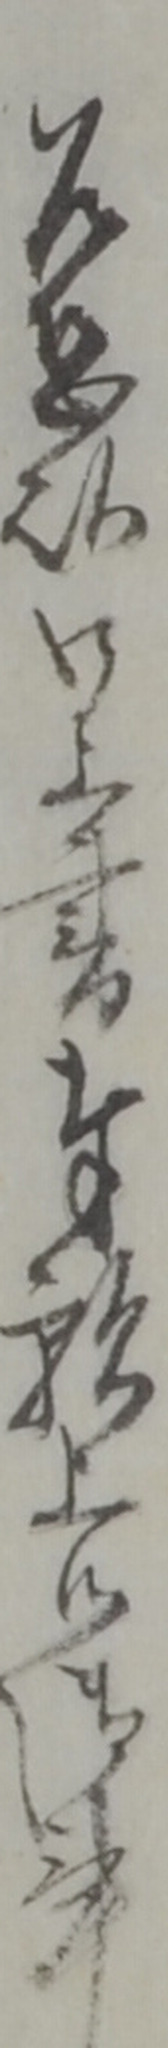乍恐以口上書奉願上候御事
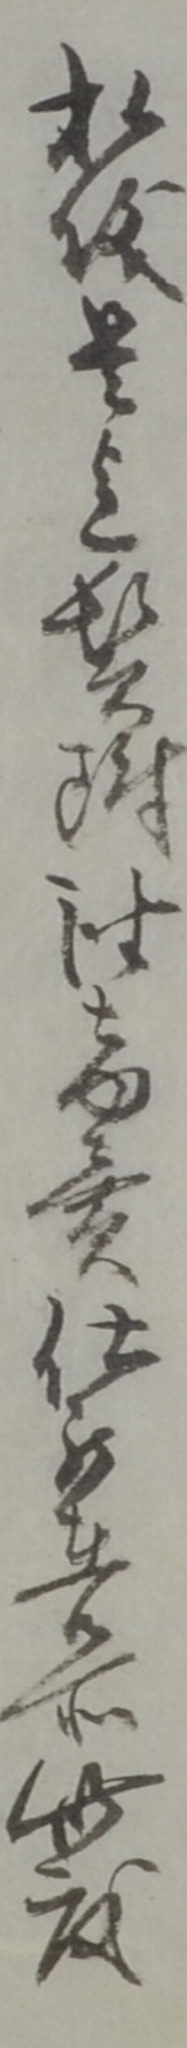私儀是迄髪附油商売仕罷在所此度
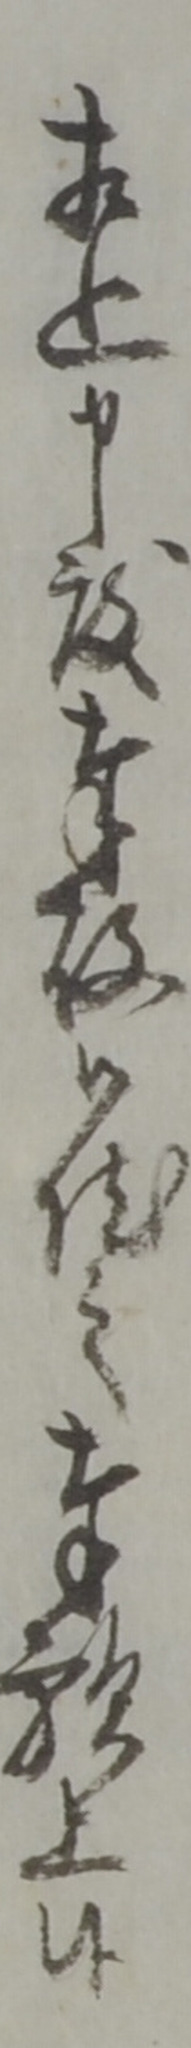相止申度奉存候依之奉願上候
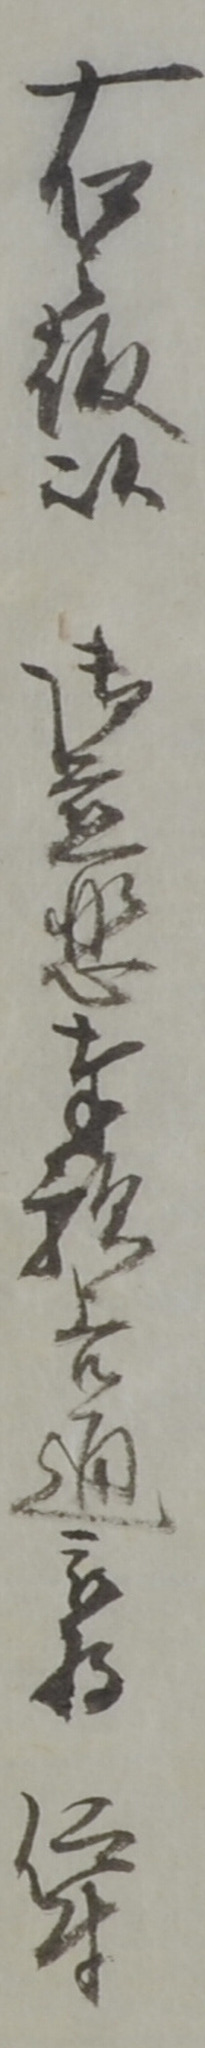右之趣以御慈悲奉願上候通被為仰付
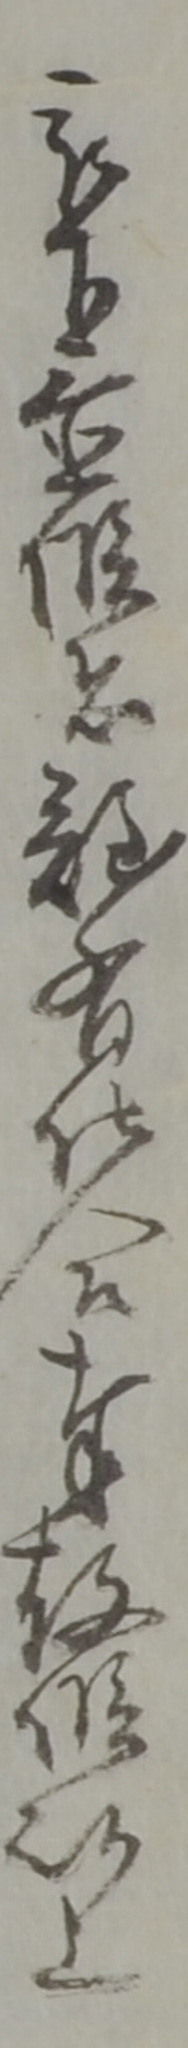被下置候者難有仕合奉存候以上
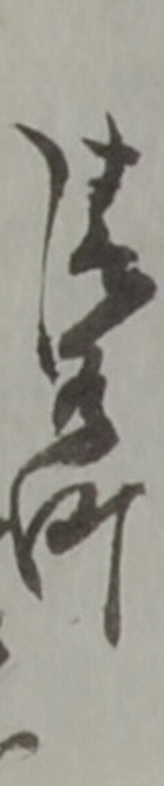清水町
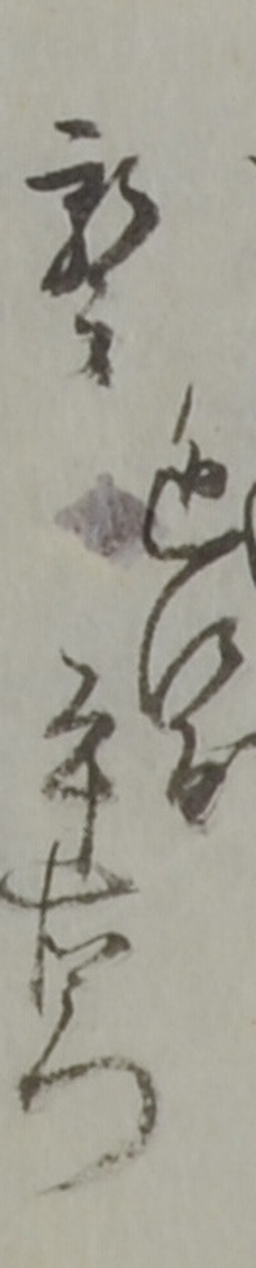願主平右衛門
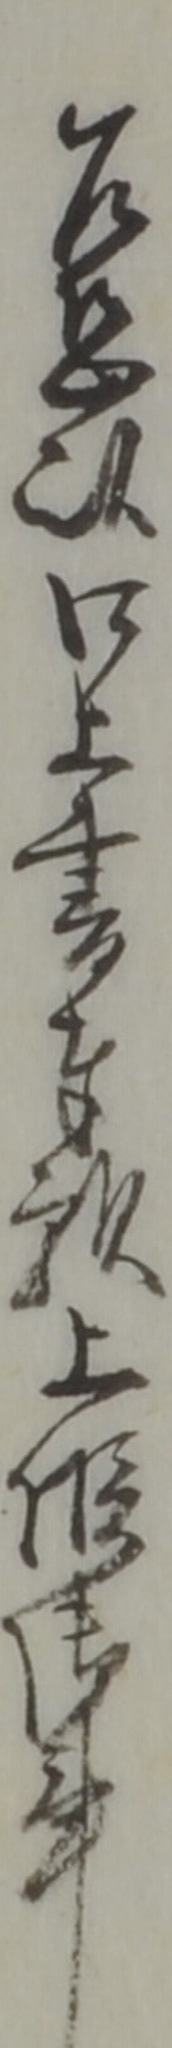乍恐以口上書奉願上候御事
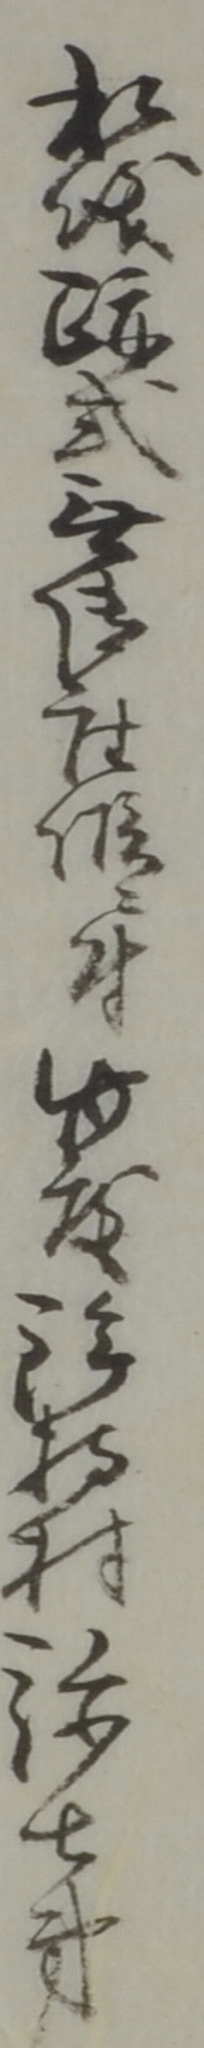私儀跡式無御座候ニ付此度鉾持村弥七弟
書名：諸願書控簿
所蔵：伊那市立高遠町図書館・合同会社AMANE
